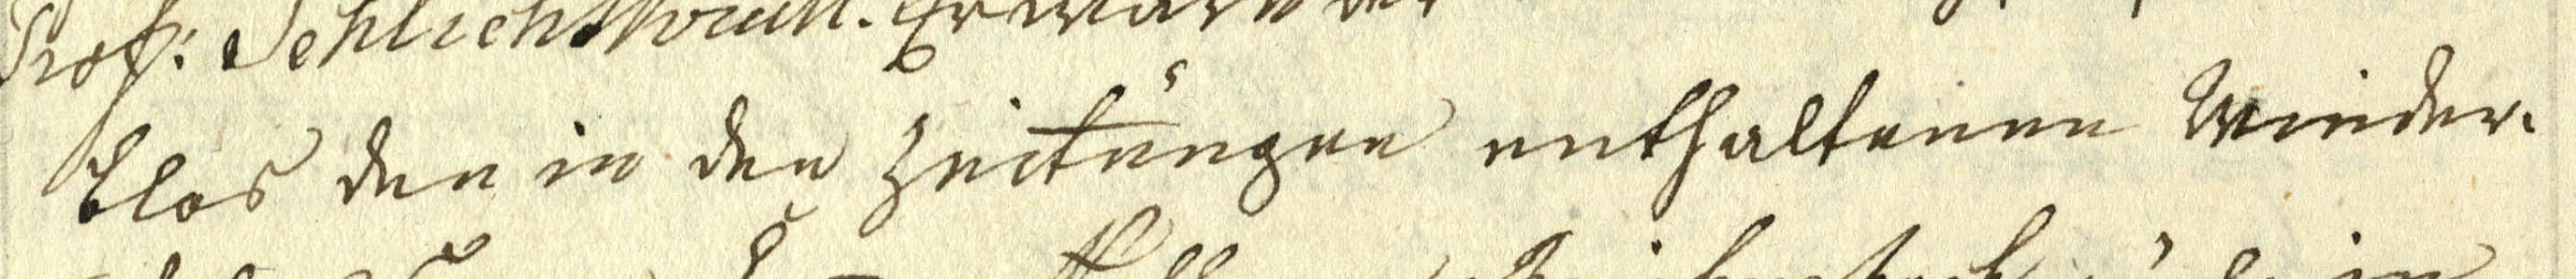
blos den in den Zeitungen enthaltenen Wieder¬
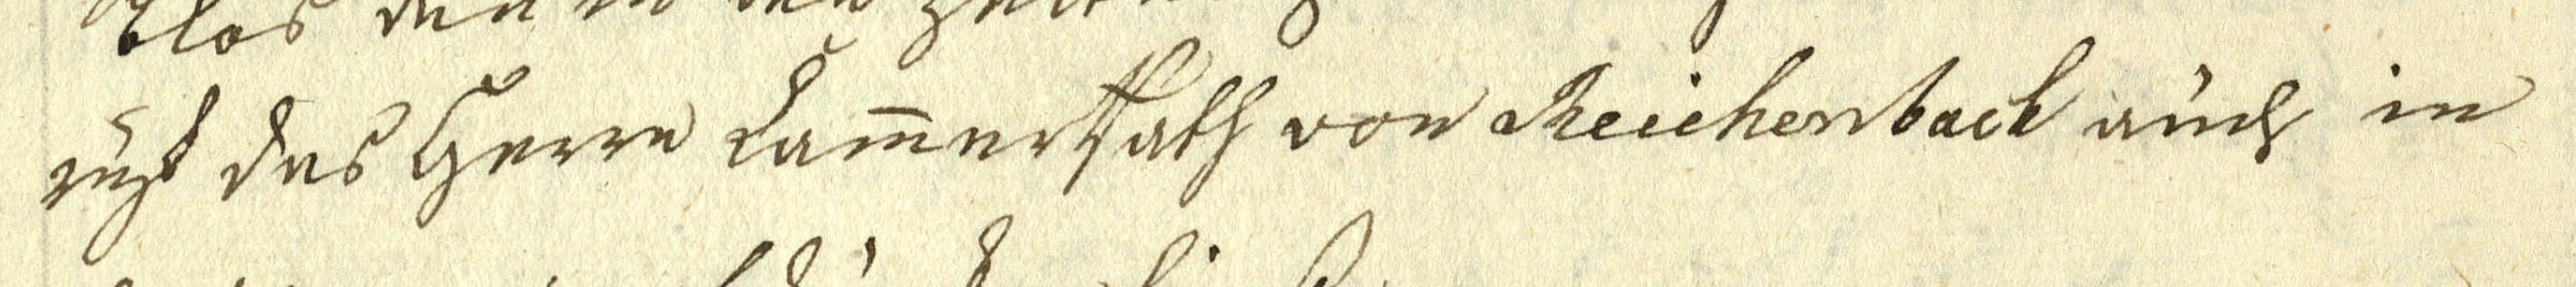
ruf des Herrn CamerRath von Reichenbach auch in
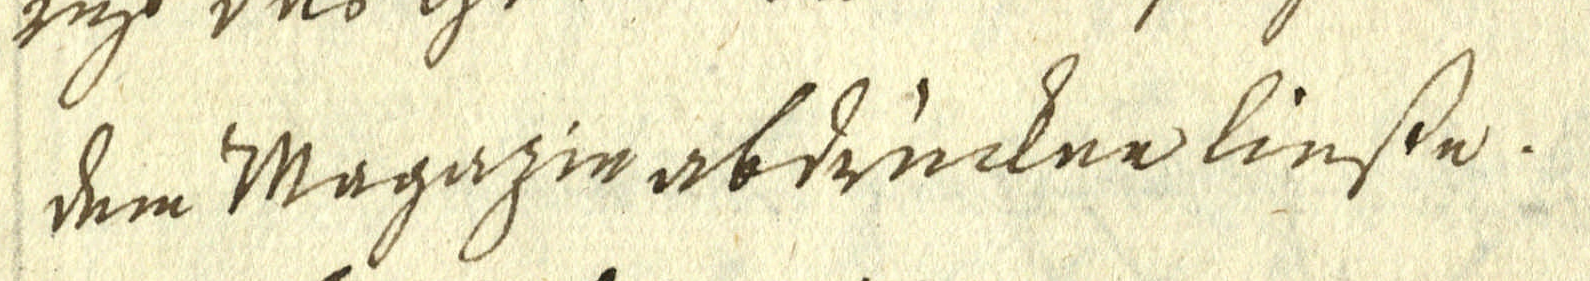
dem Magazin abdrucken ließe.
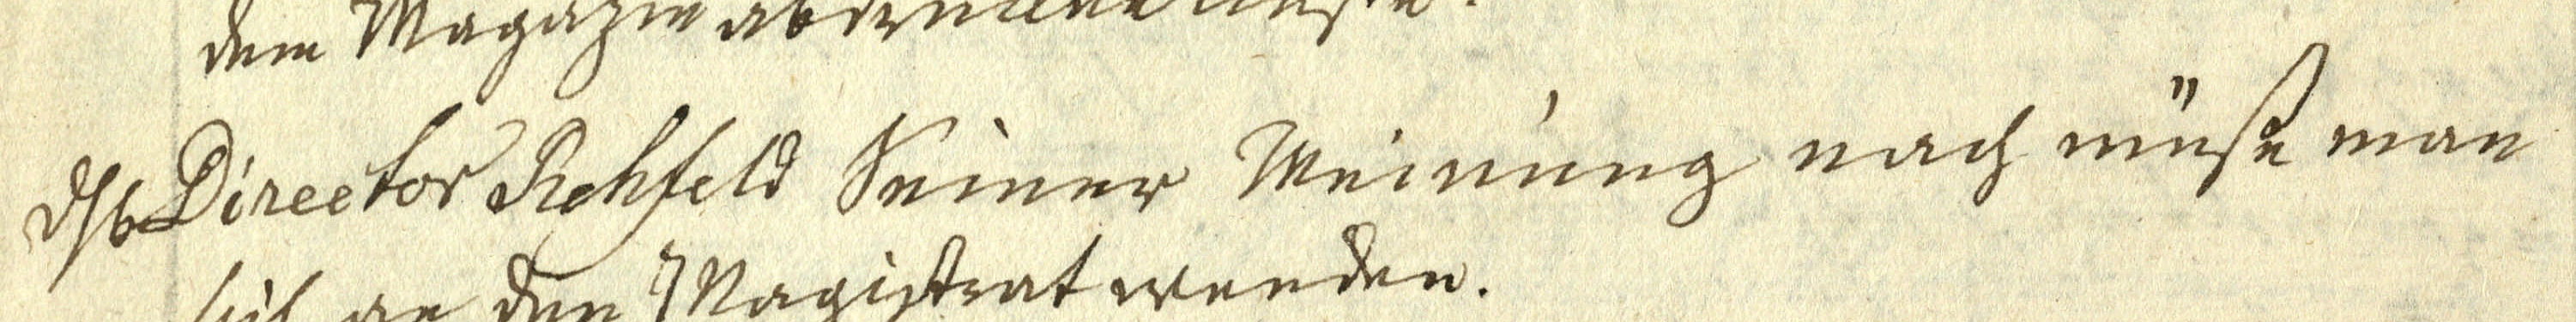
dh Director Rehfeld Seiner Meinung nach müße man
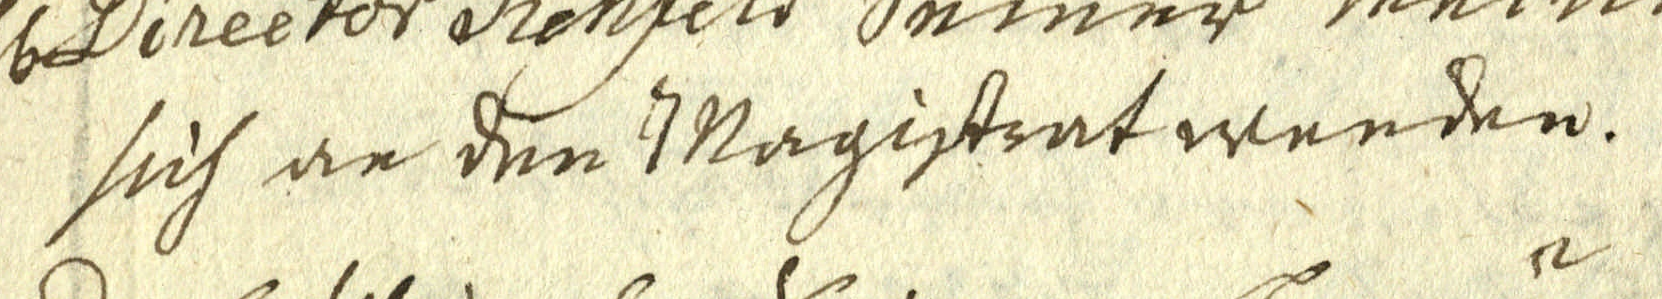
sich an den Magistrat wenden.
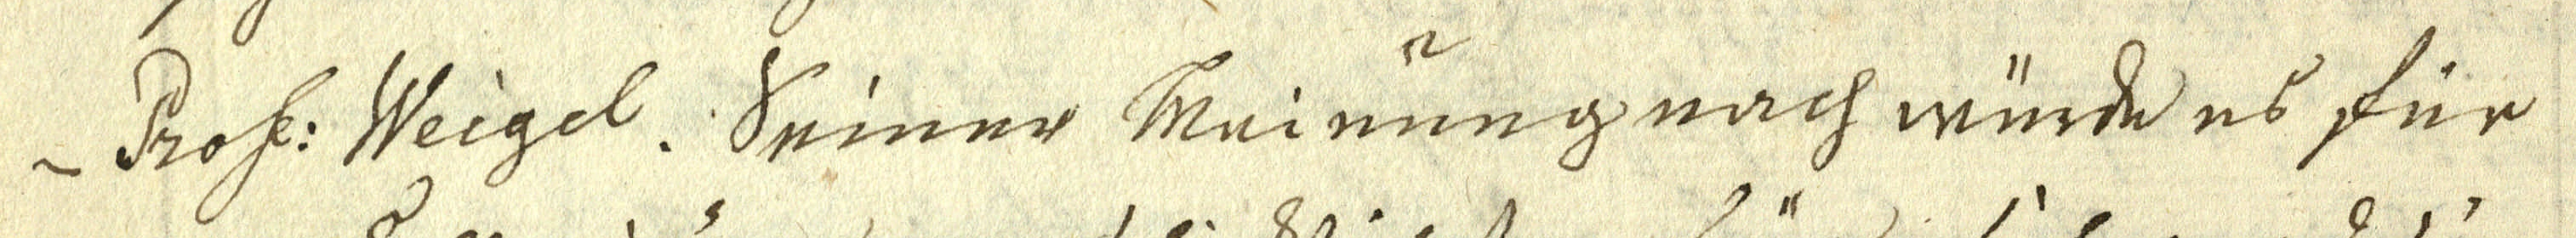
Prof. Weigel. Seiner Meinung nach würde es für
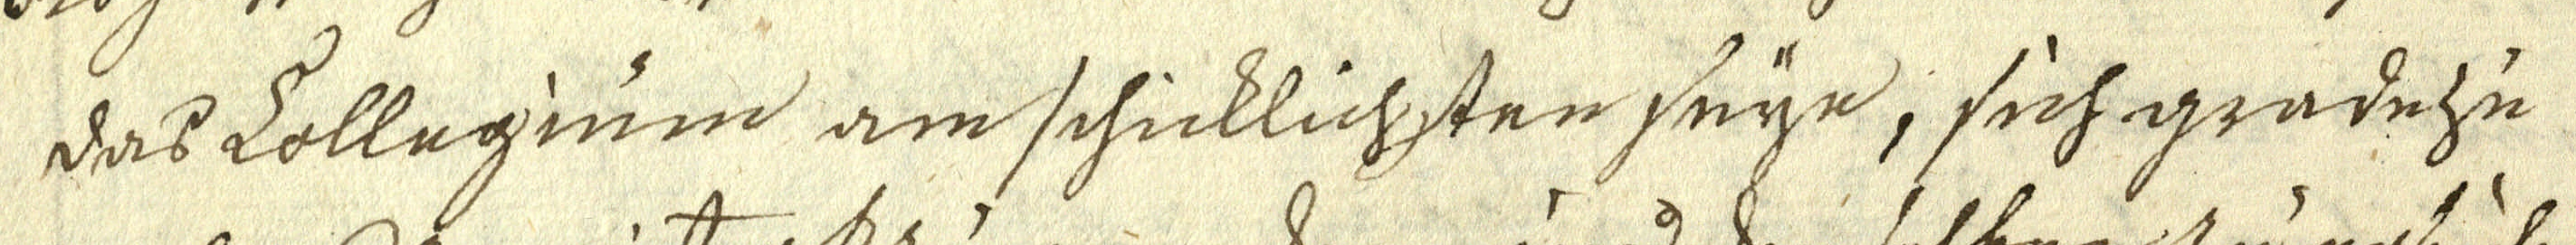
das Collegium am schicklichsten seÿn, sich gradezu
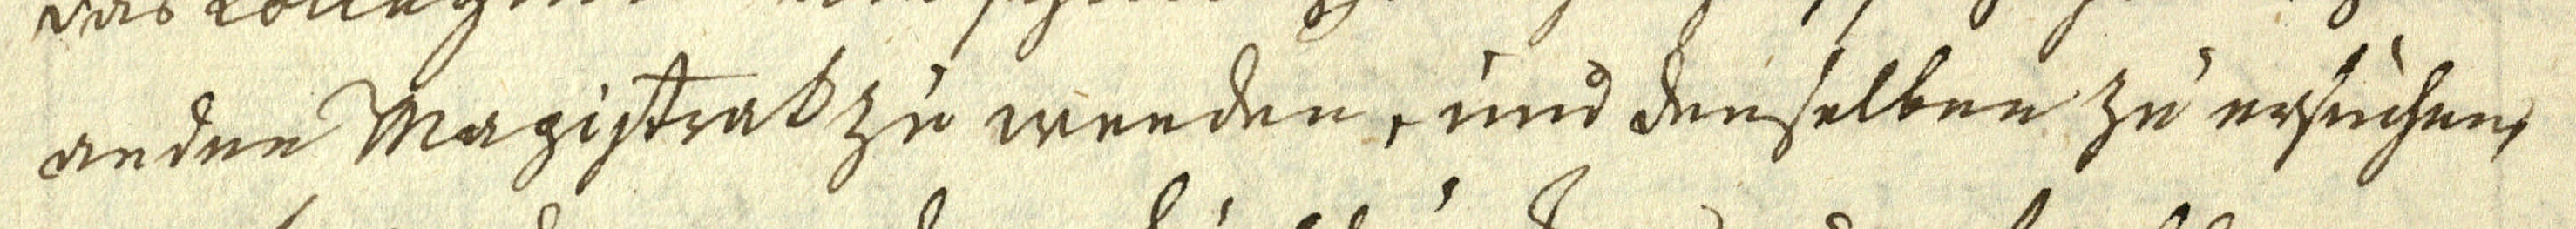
an den Magistrat zu wenden, und denselben zu ersuchen,
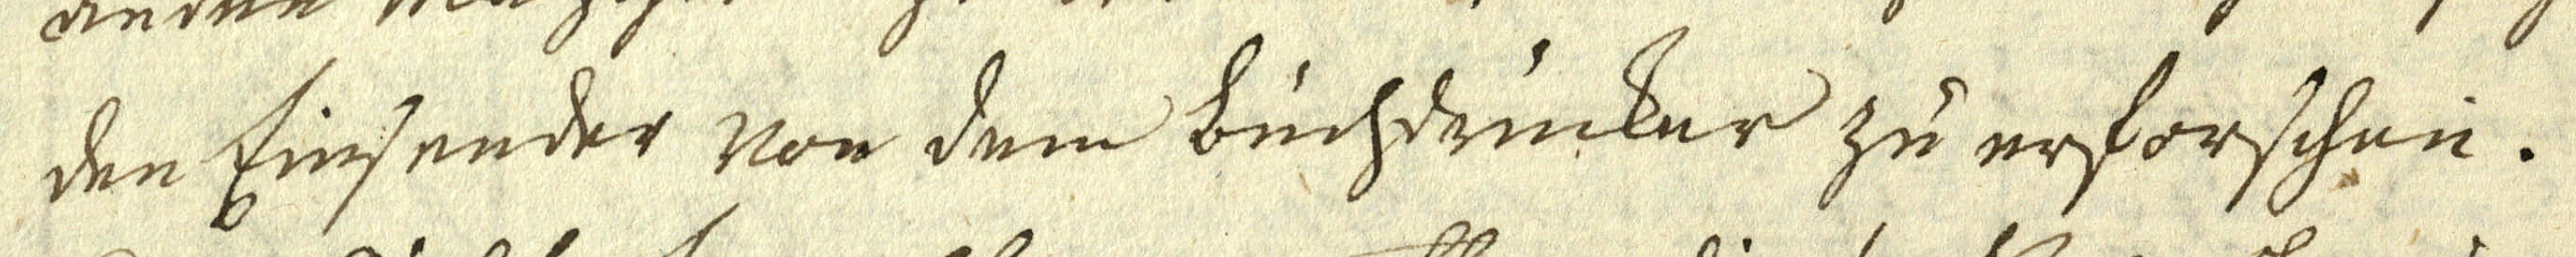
den Einsender von dem Buchdrucker zu erforschen.
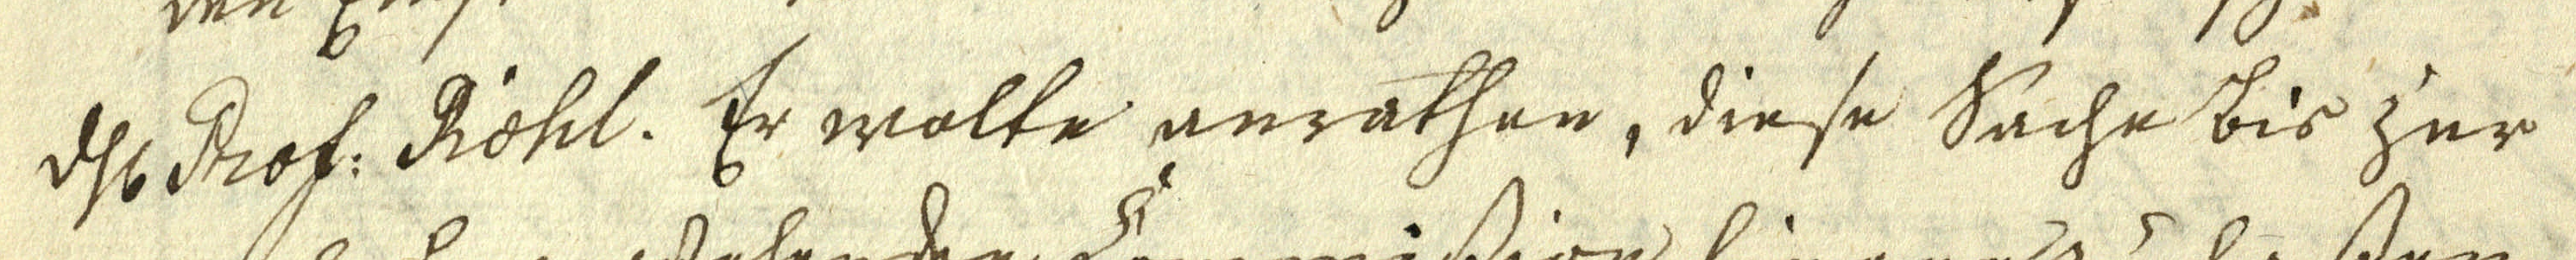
dh Prof. Röhl. Er wolle anrathen, diese Sache bis zur
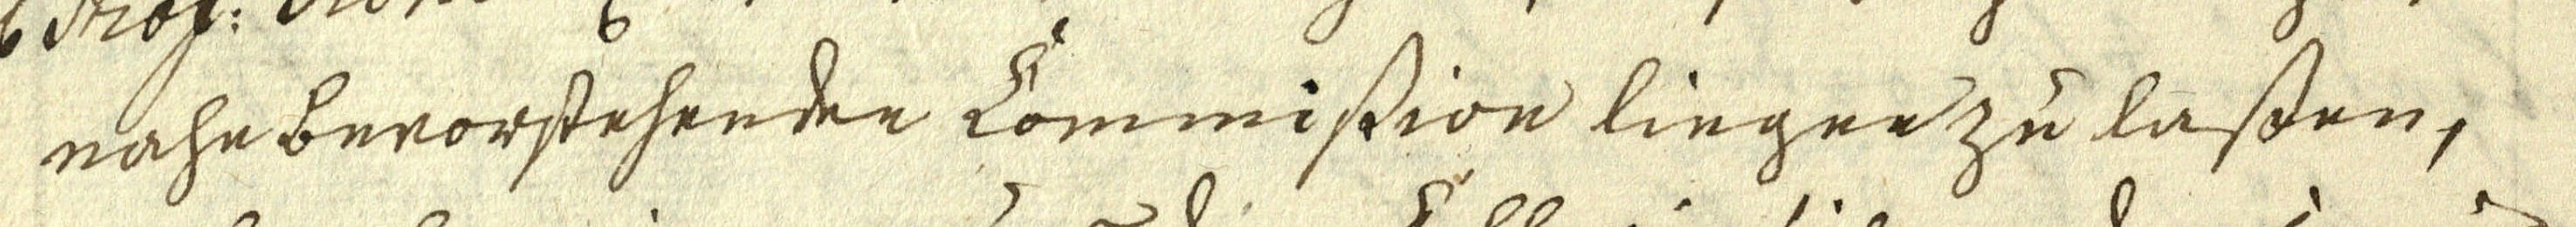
nahe bevorstehenden Commission liegen zu laßen,
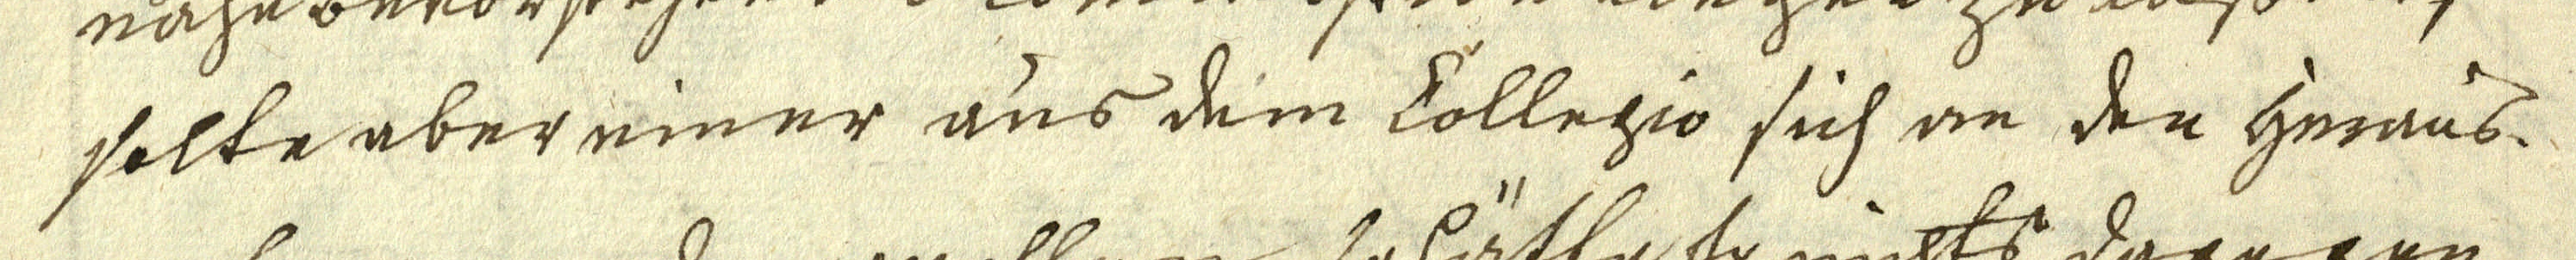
solte aber einer aus dem Collegio sich an den Heraus¬
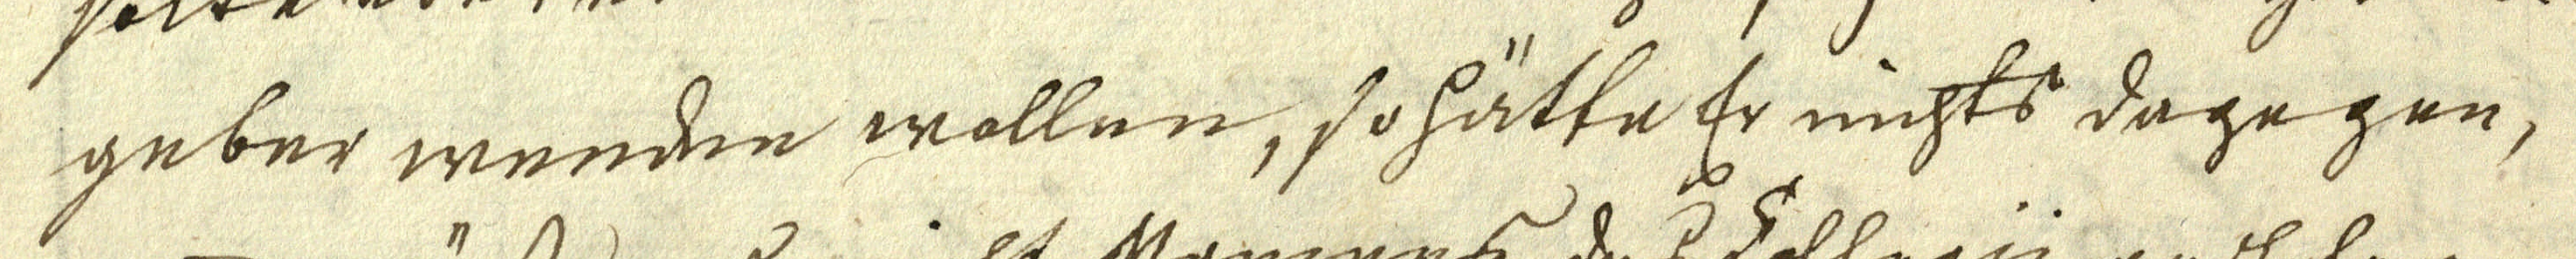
geber wenden wollen, so hätte Er nichts dagegen,
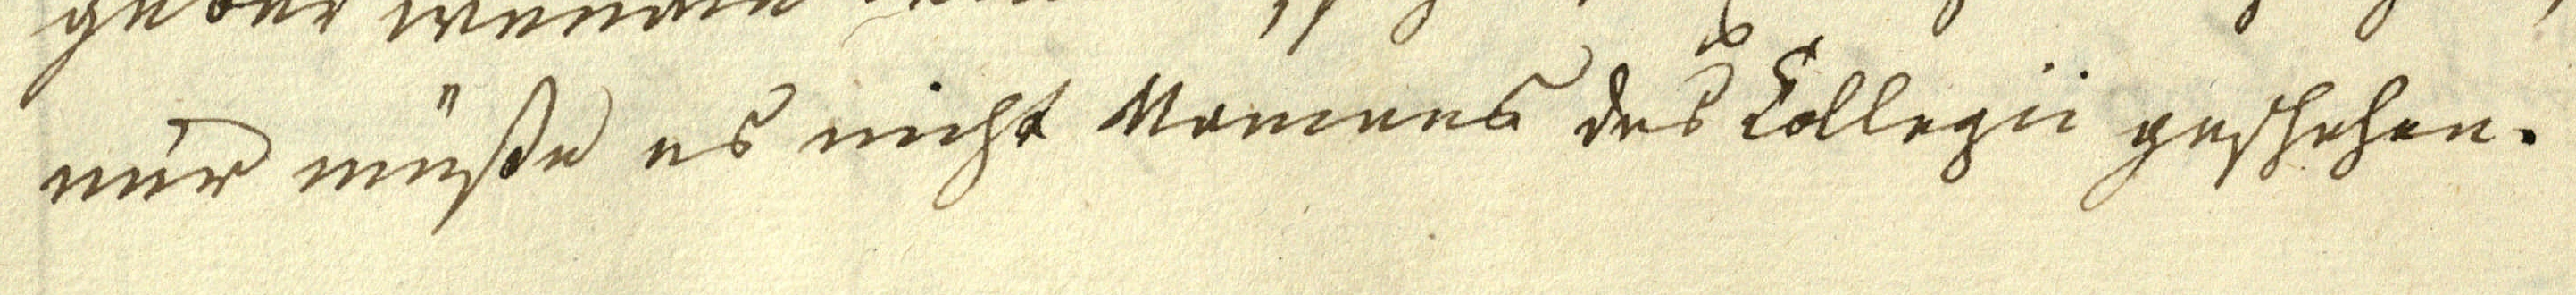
nur müße es nicht Namens des Collegii geschehen.
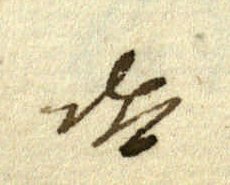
dh
